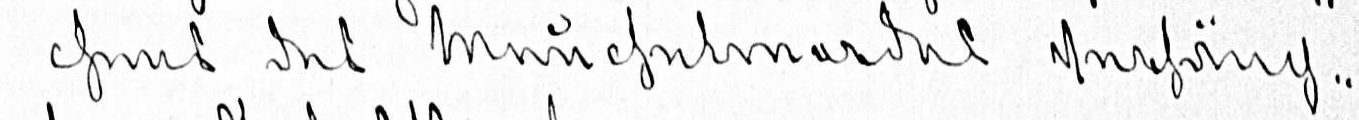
chens des Meuchelmordes verhäng¬
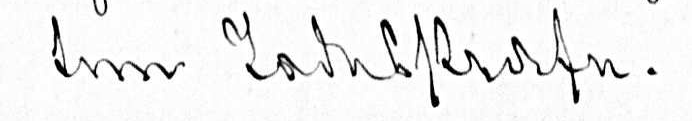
ten Todesstrafe.
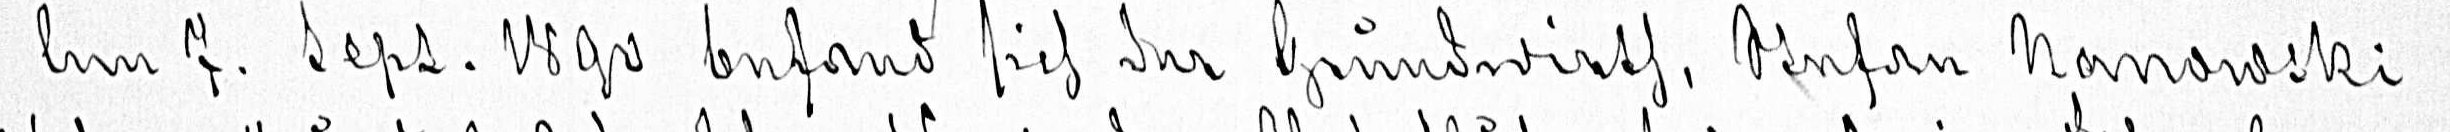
Am 7. Sept. 1890 befand sich der Grundwirth, Stefan Nanowski
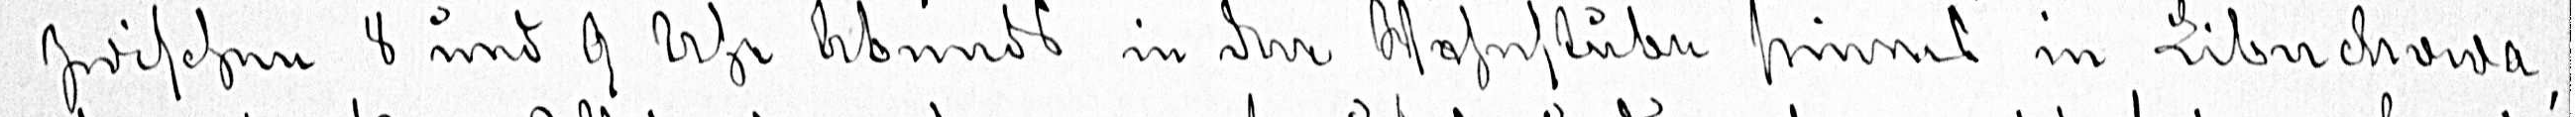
zwischen 8 und 9 Uhr Abends in der Wohnstube seines in Zibuchowa,
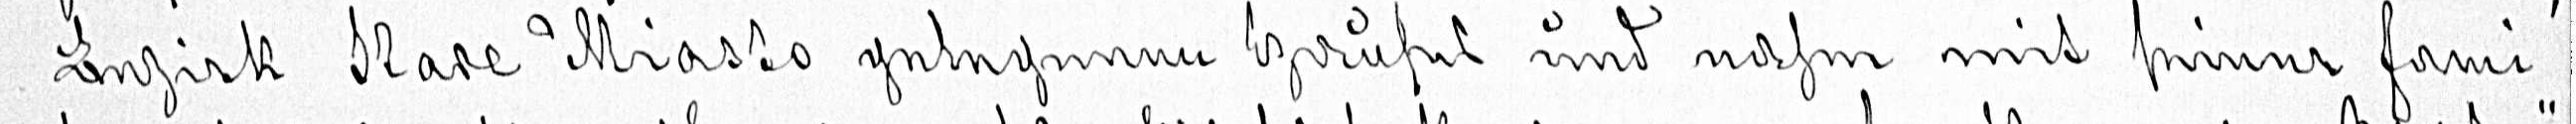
Bezirk Stare Miaslo gelegenen Hauses und nahm mit seiner Fami¬
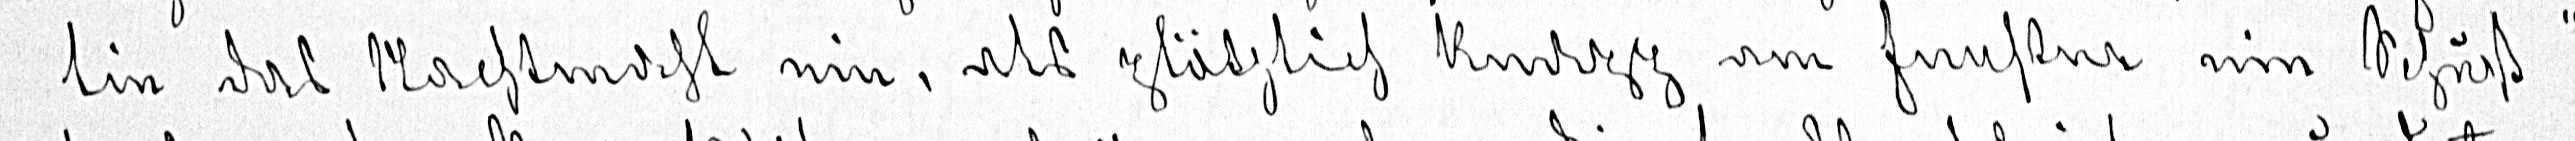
lie das Nachtmahl ein, als plötzlich knapp am Fenster ein Schuß
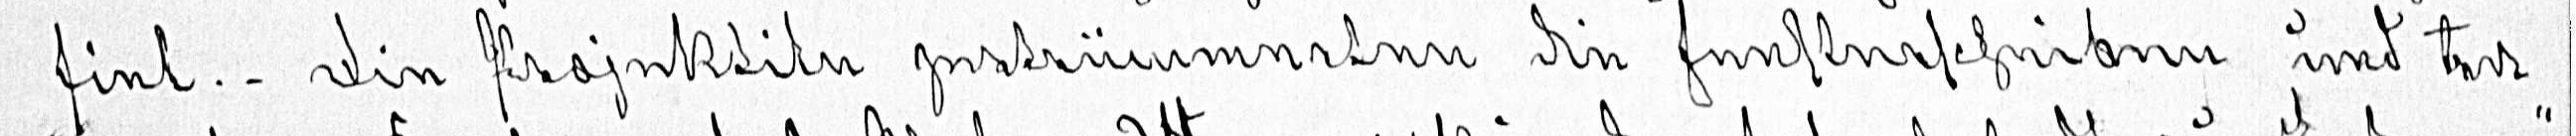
fiel. Die Projektile zertrümmerten die Fensterscheiben und tra¬
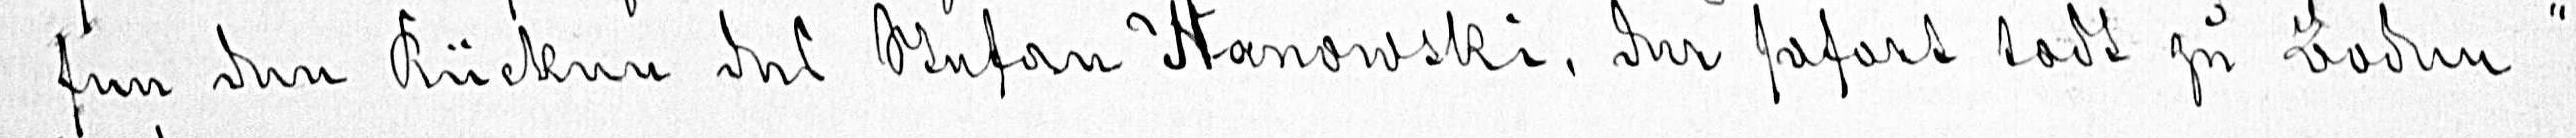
fen den Rücken des Stefan Nanowski, der sofort todt zu Boden
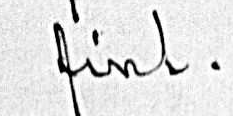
fiel.
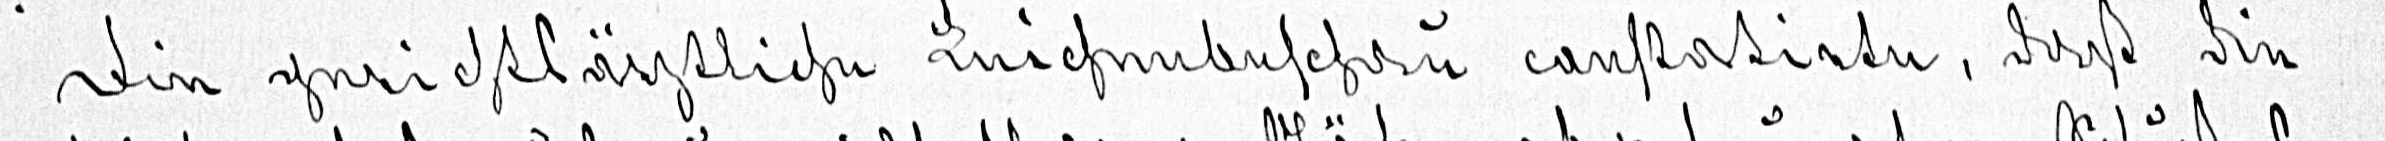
Die gerichtsärztliche Leichenbeschau constatirte, daß die
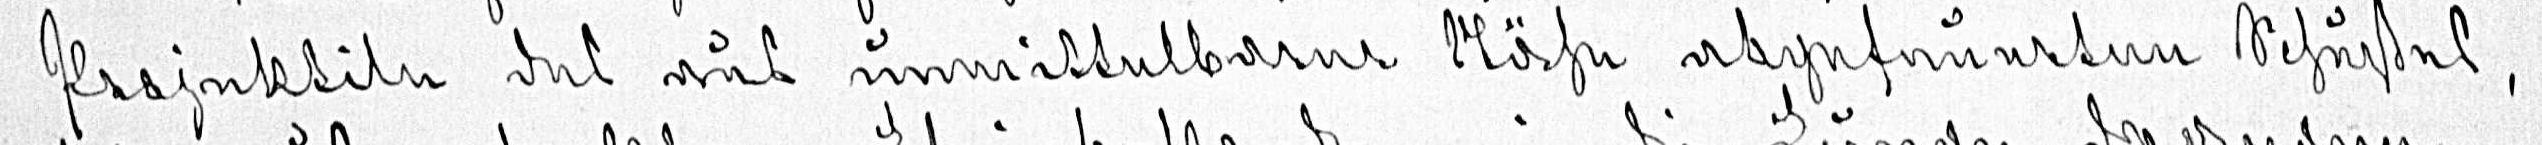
Projektile des aus unmittelbaren Nähe abgefeuerten Schußes,
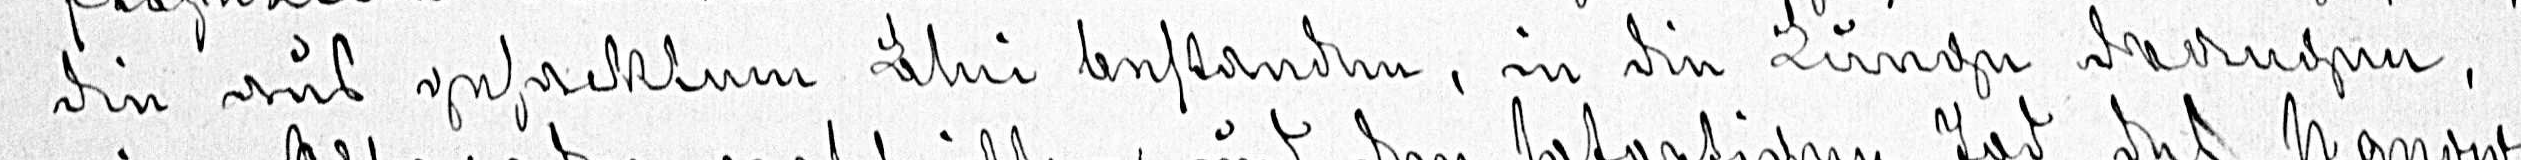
die aus gehacktem Blei bestanden, in die Lunge drangen,
